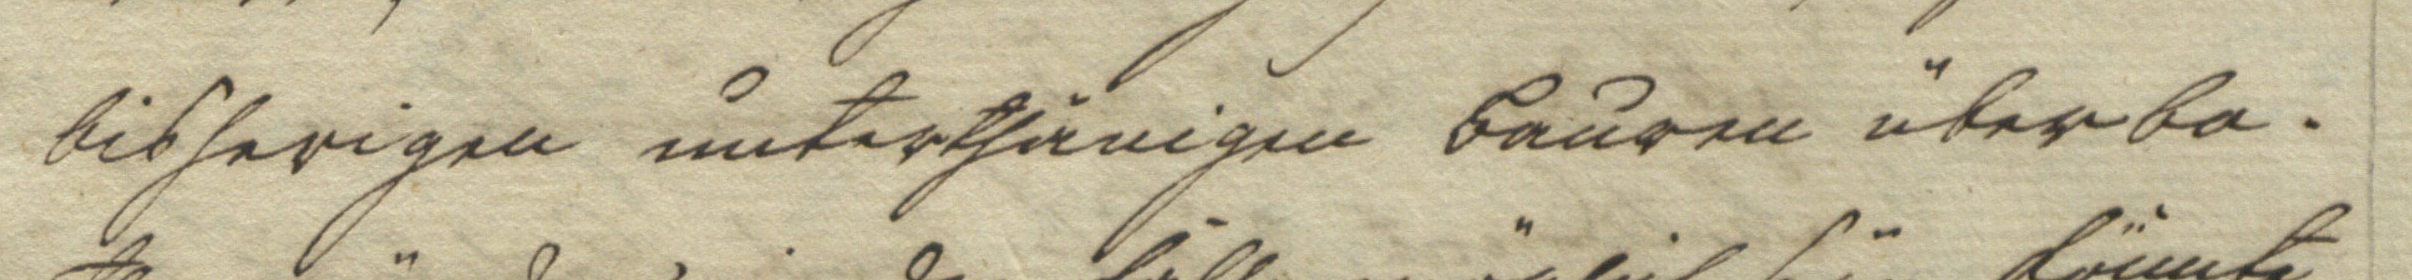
bisherigen unterthänigen Bauren überbo-
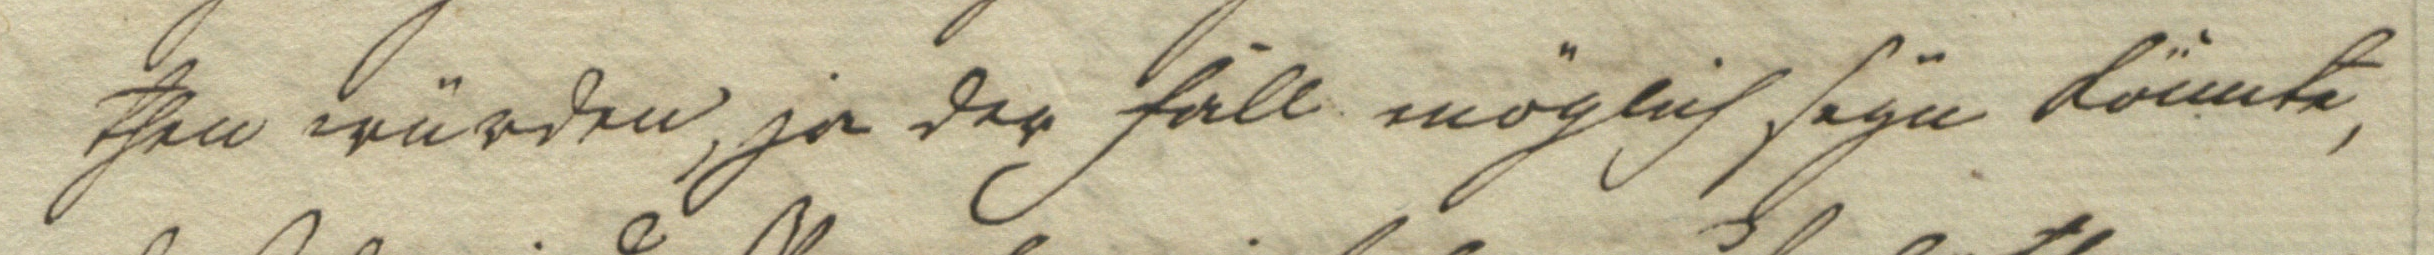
then würden, ja der Fall möglich seyn könnte,
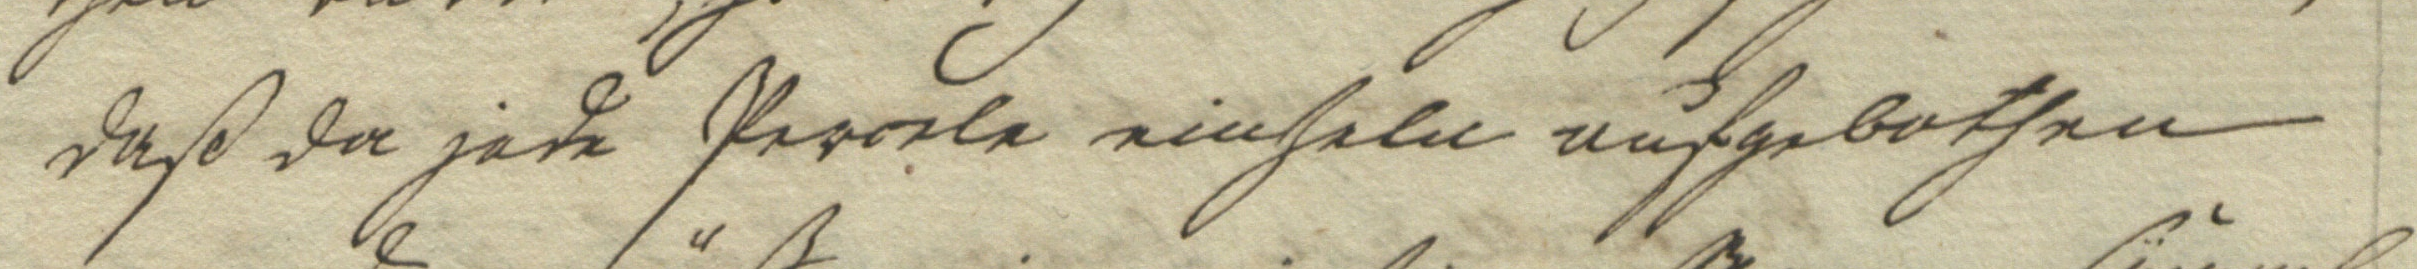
daß da jede Parcele einzeln aufgebothen
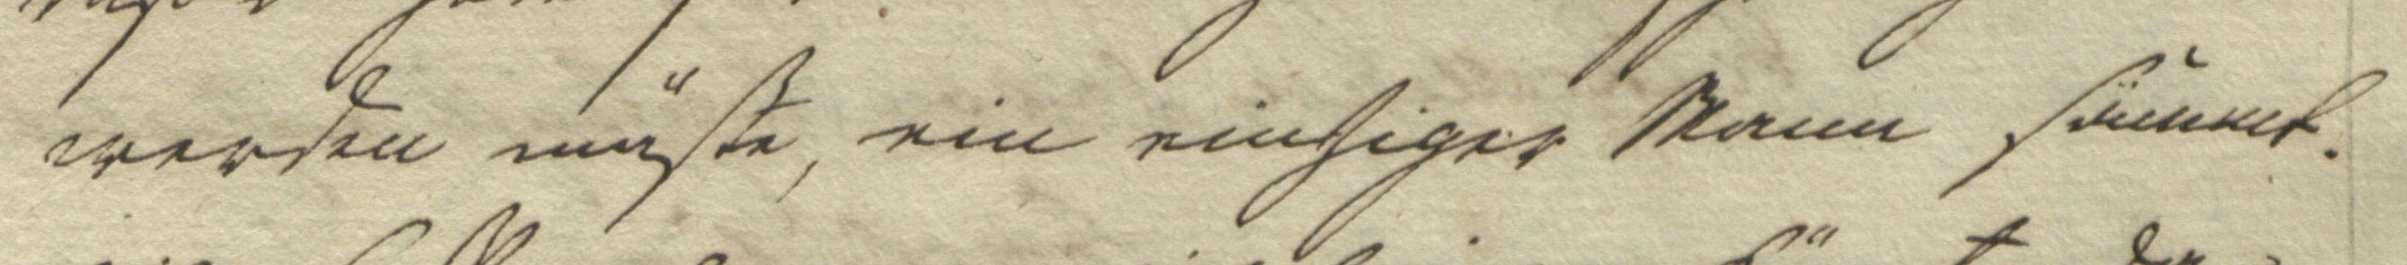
werden müßte, ein einziger Mann sämmt-
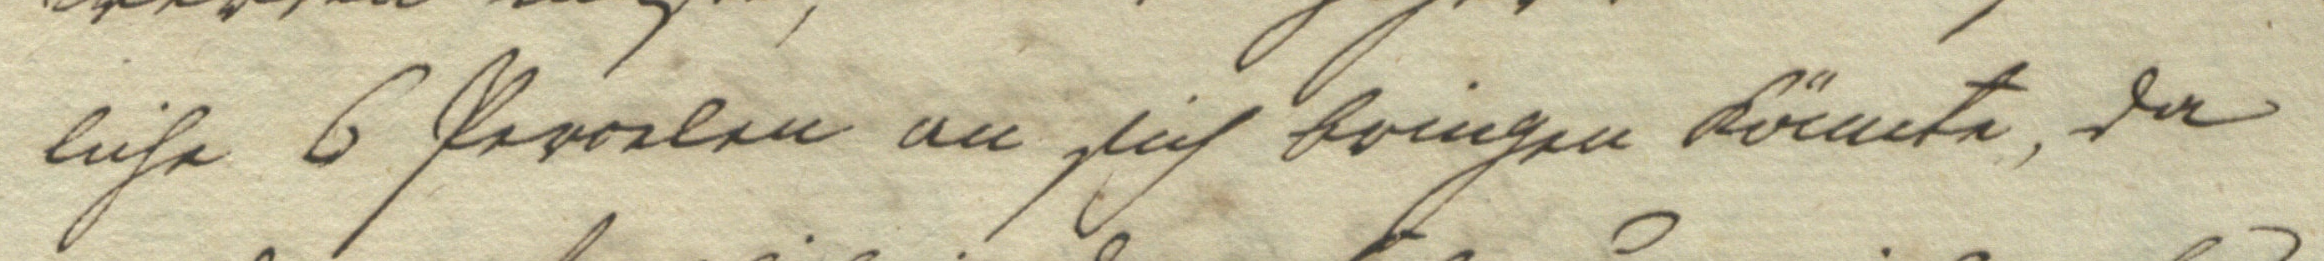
liche 6 Parcelen an sich bringen könnte, da
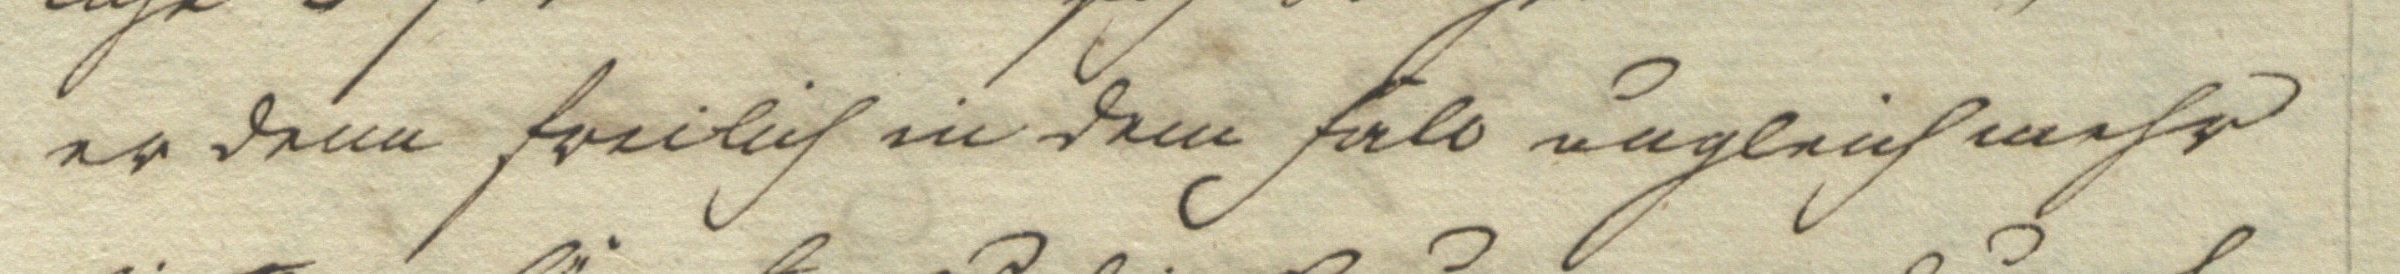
er denn freilich in dem Fall ungleich mehr
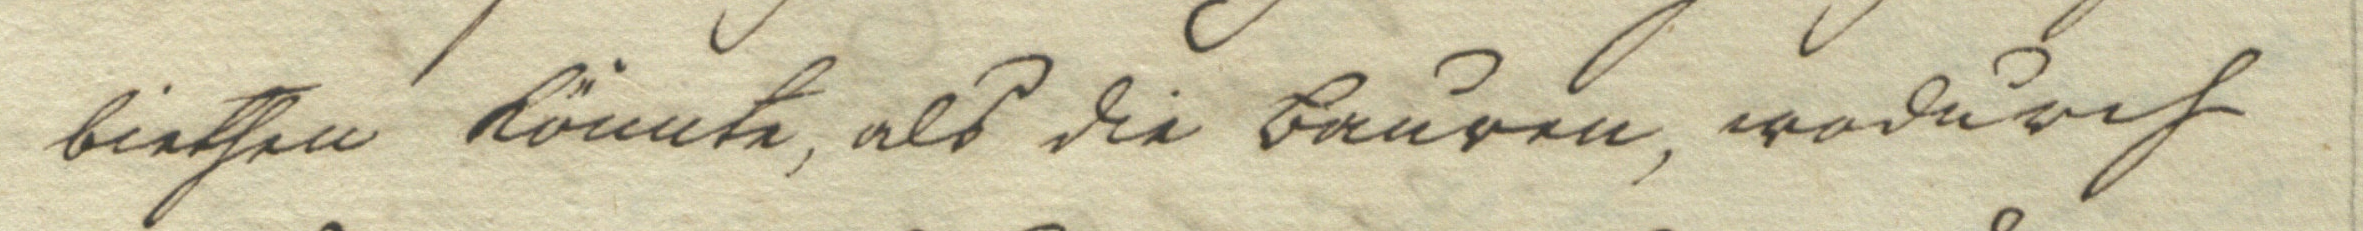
biethen könnte, als die Bauren, wodurch
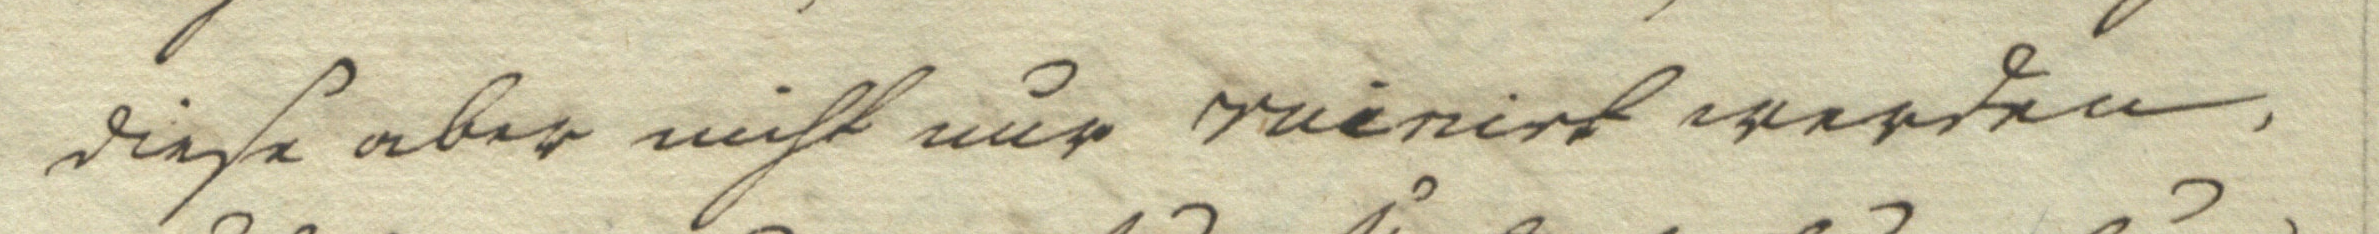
diese aber nicht nur ruinirt werden,
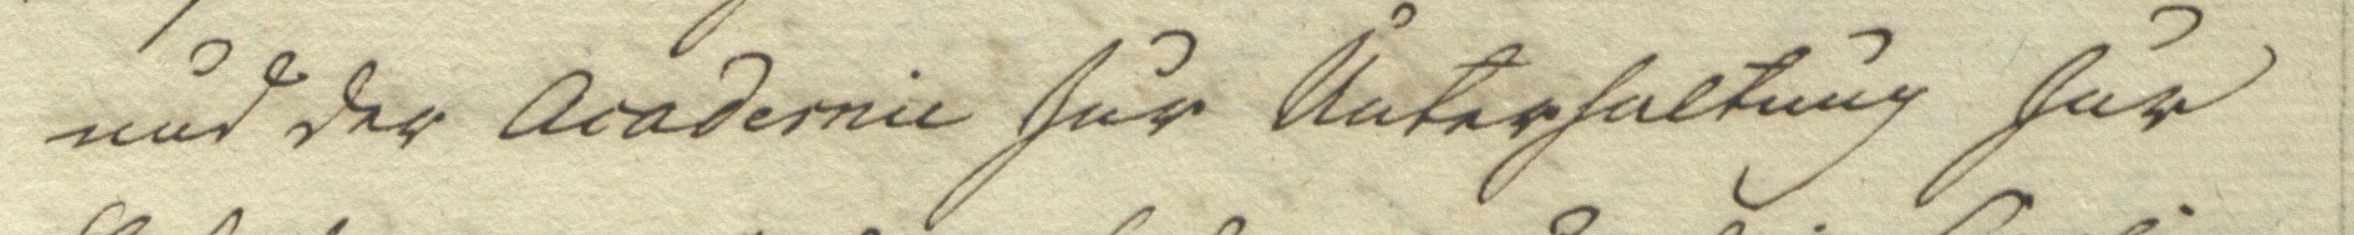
und der Academie zur Unterhaltung zur
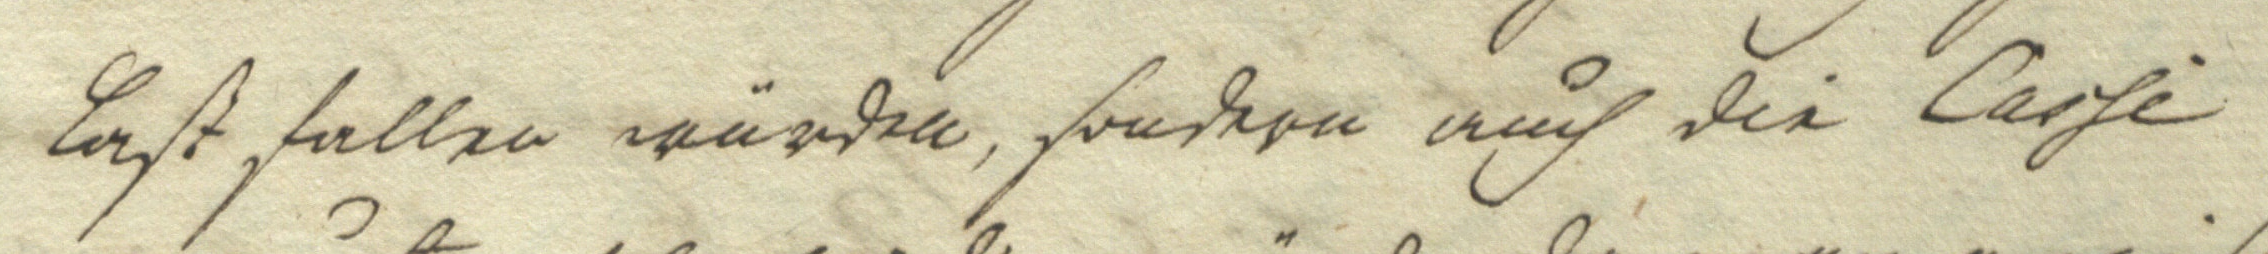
Last fallen würden, sondern auch die Casse
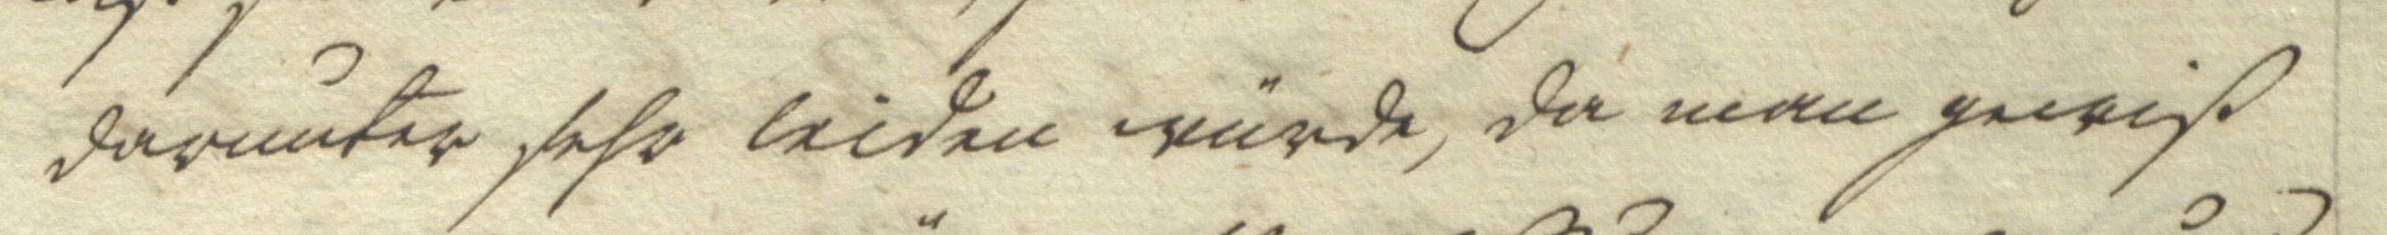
darunter sehr leiden würde, da man gewiß
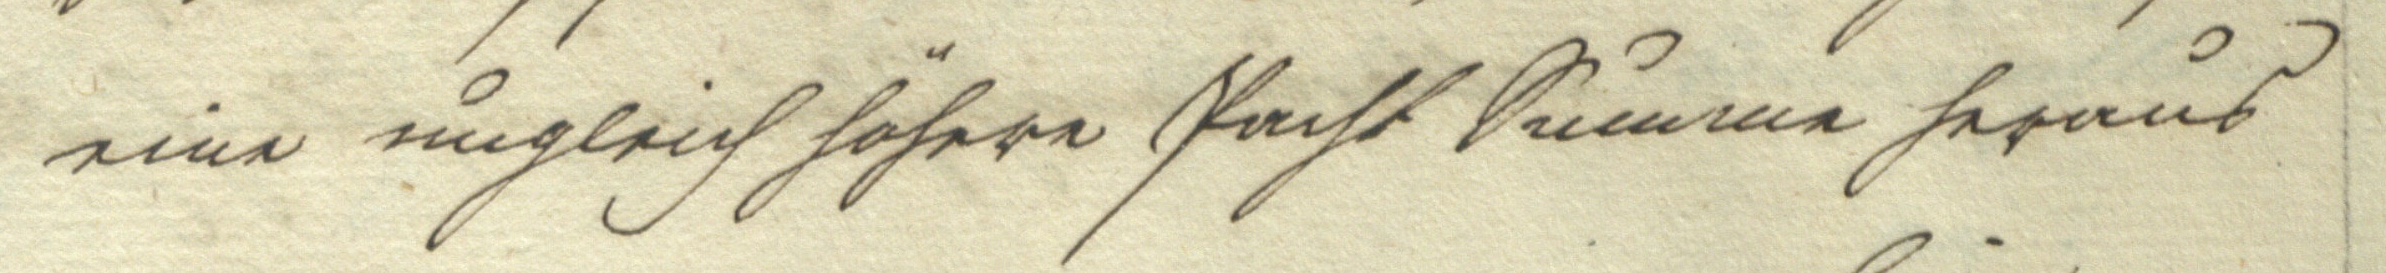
eine ungleich höhere Pacht Summe heraus
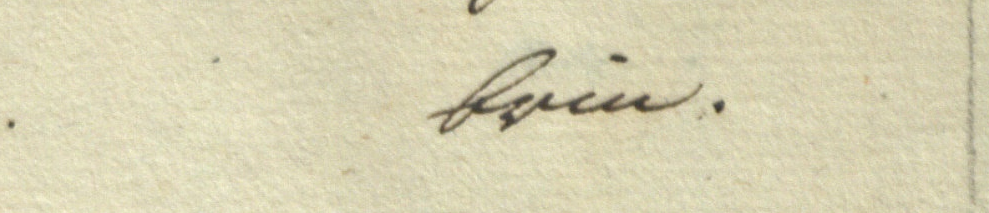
brin-
